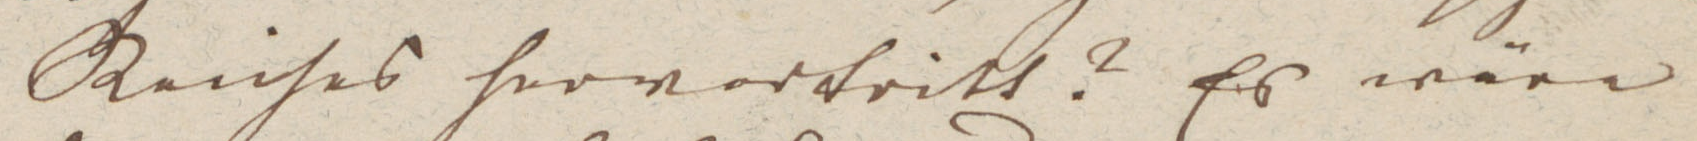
Reiches hervortritt? Es wäre
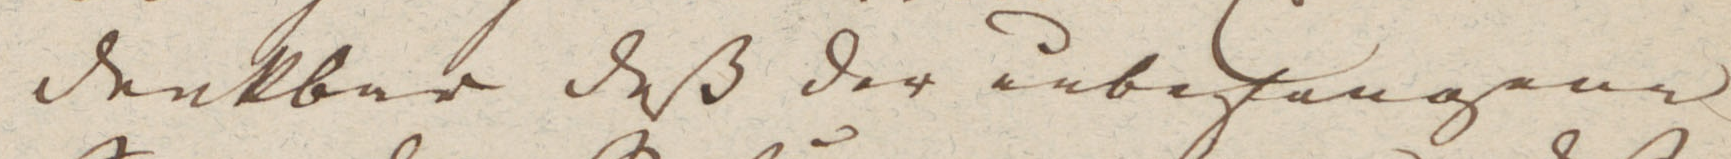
denkbar dass der unbefangene
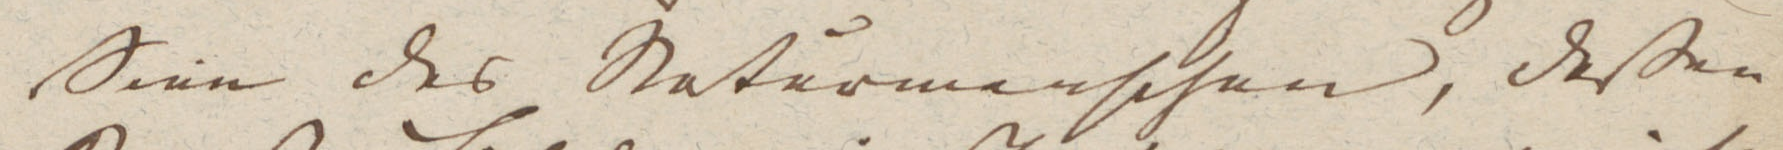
Sinn des Naturmenschen, dessen
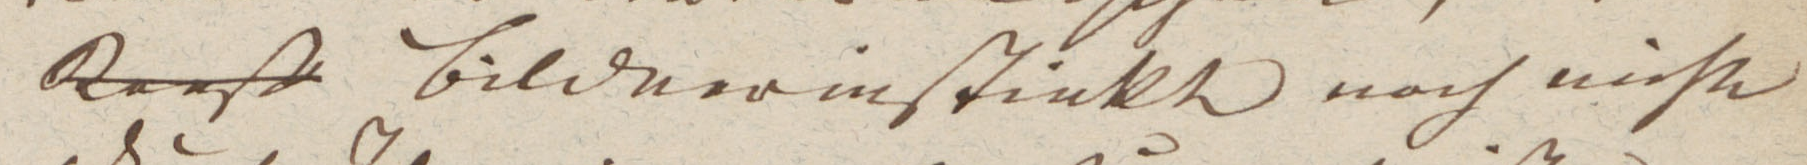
Kunst Bildnerinstinkt noch nicht
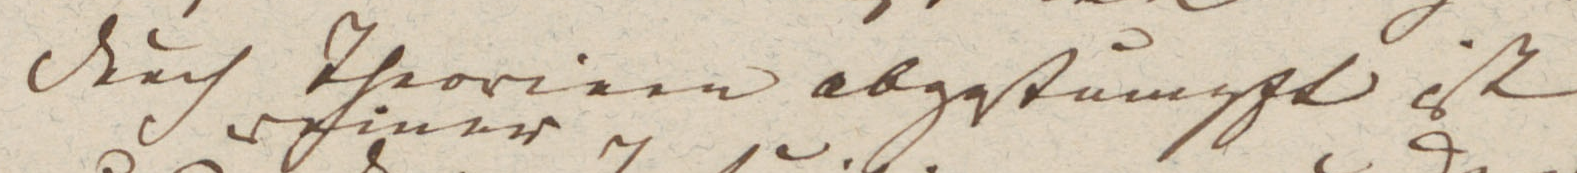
durch Theorieen abgestumpft ist
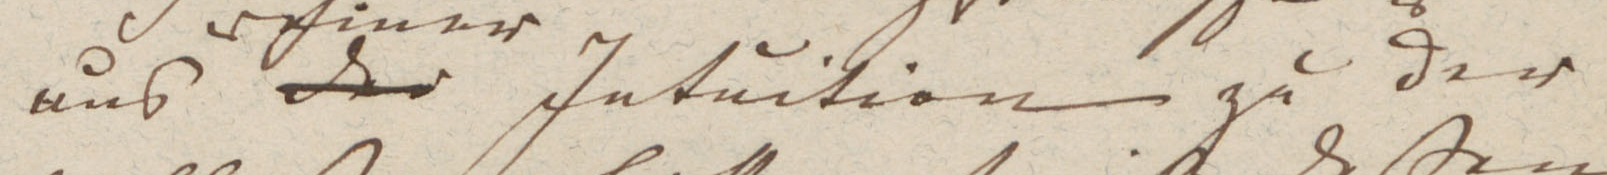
aus der reiner Intuition zu der
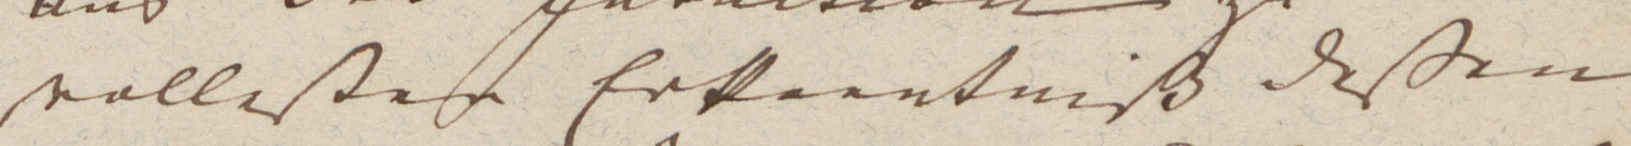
vollsten Erkenntniss dessen
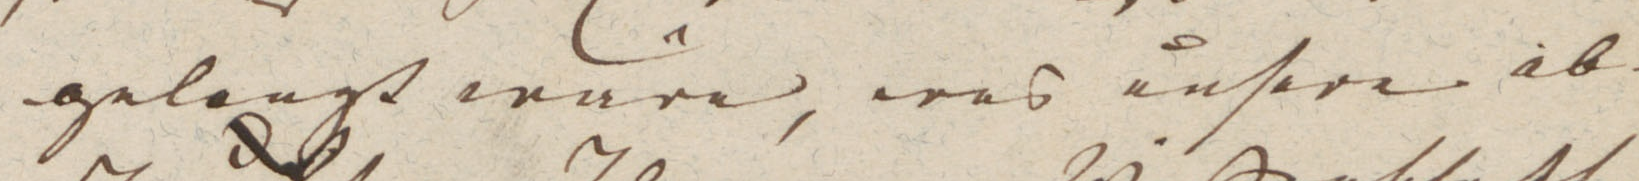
gelangt wäre, was unsere ab-
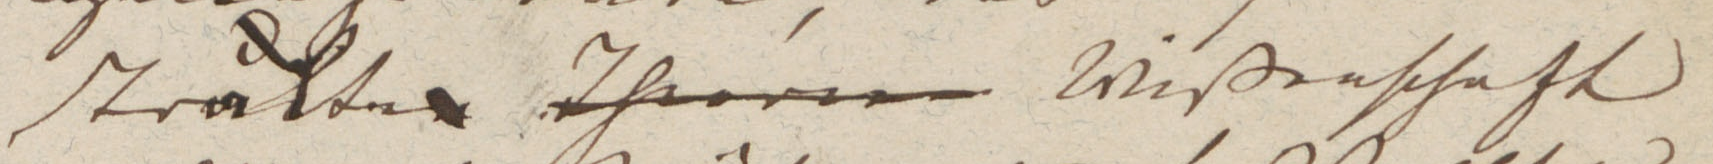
strucakten Theorien Wissenschaft
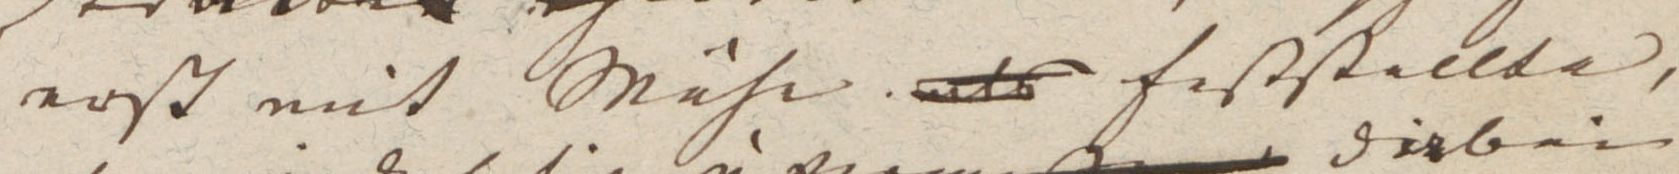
erst mit Mühe als feststellte,
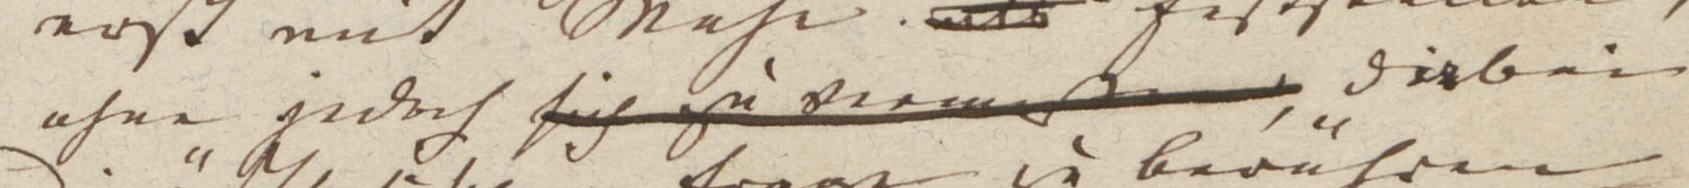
ohne jedoch sich zu vermessen, dieabei
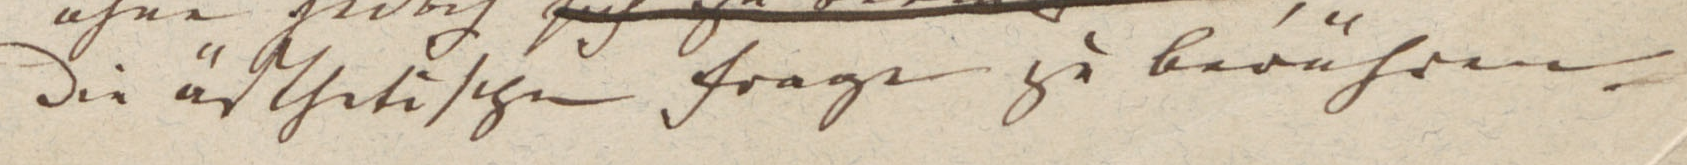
die ästhetische Frage zu berühren.
